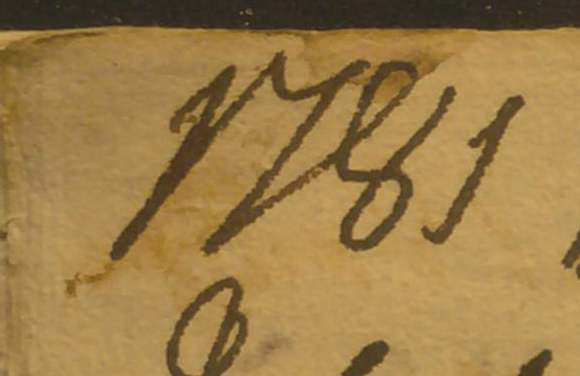1781
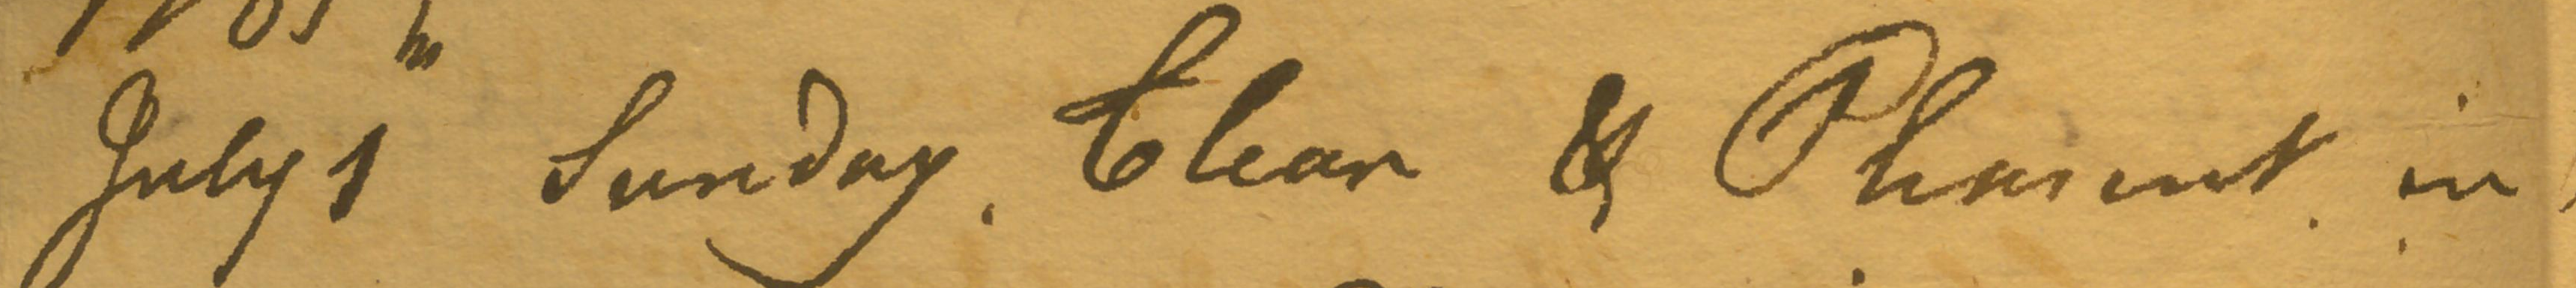July 1 Sunday Clear & Pleasent in
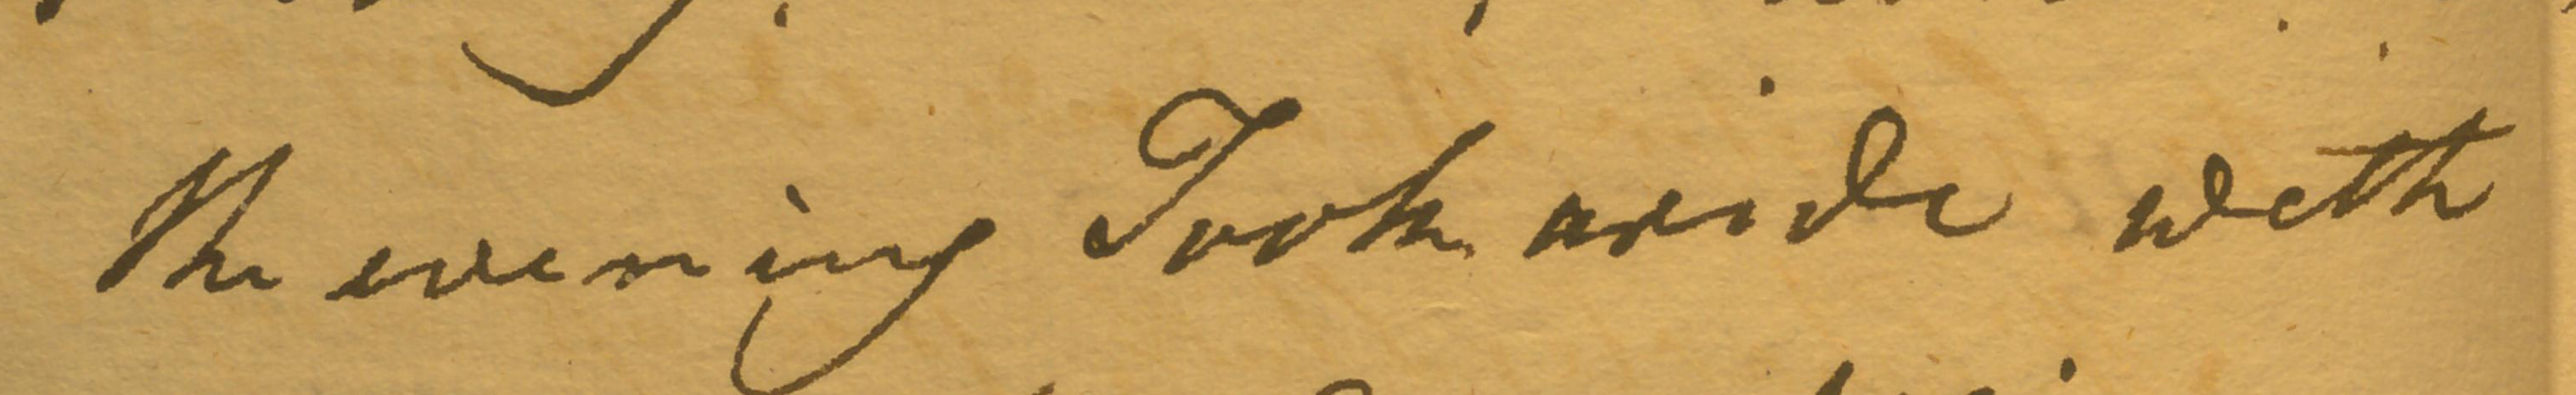the eveming Took a ride with
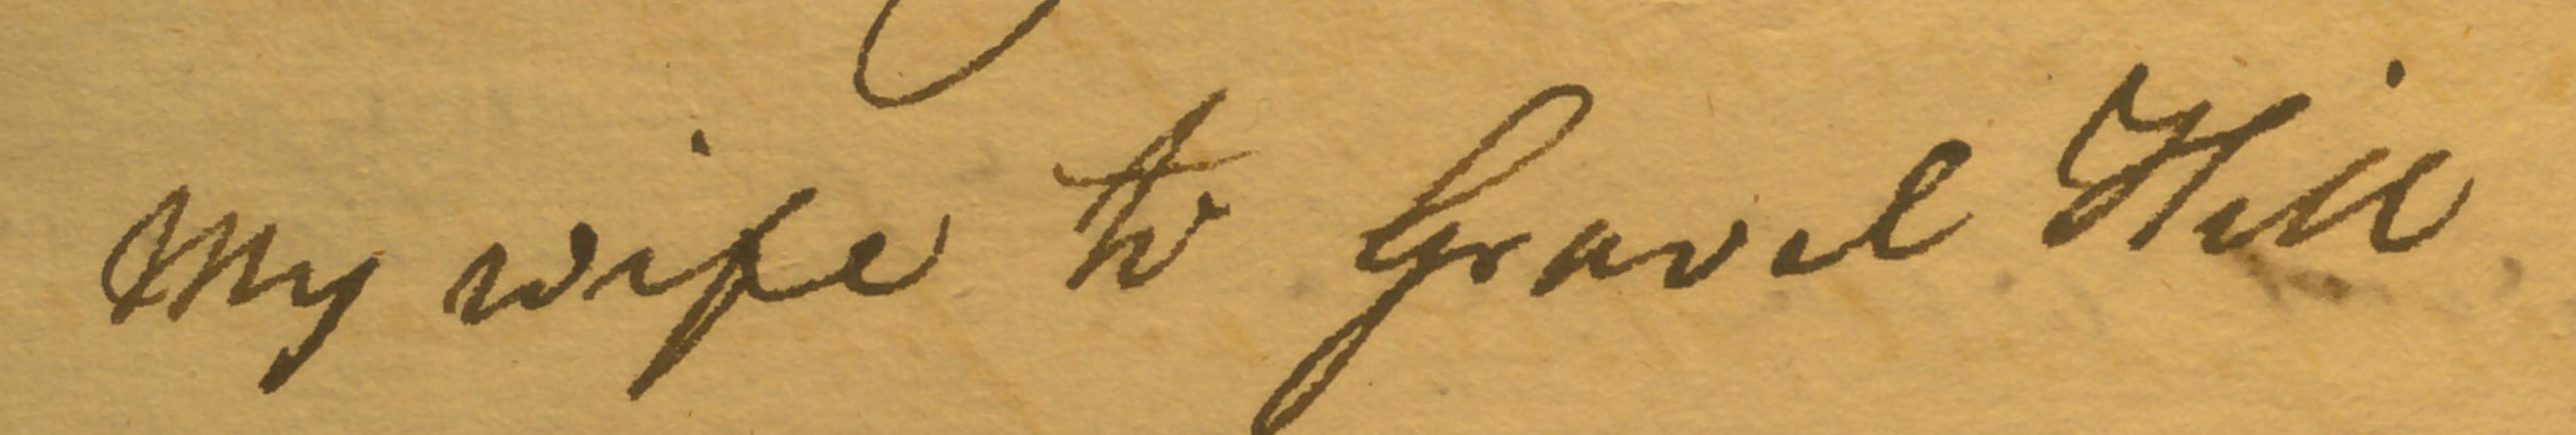My waife to Gravel Hill
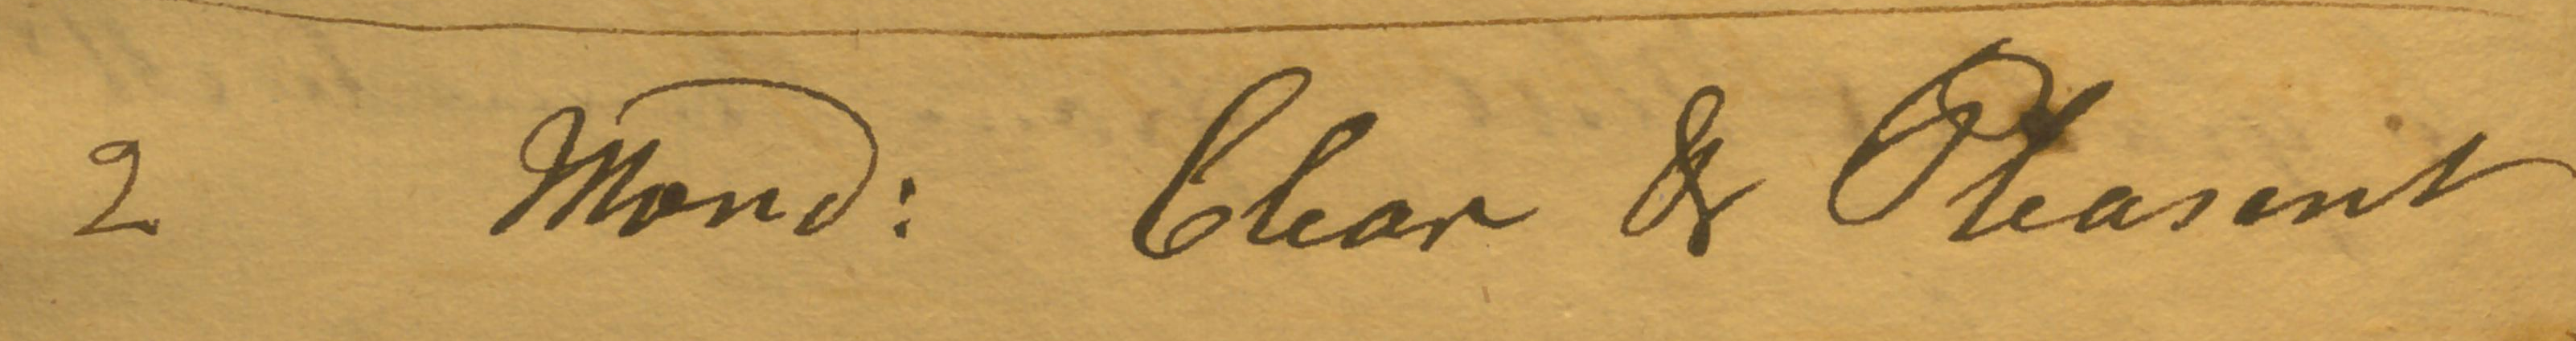2 Mond: Clear & Pleasent
